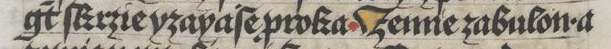ḡt ſkrzie yzayaẛe proka.Zemie zabulon.a
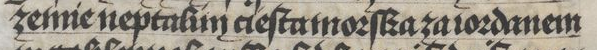zemie neptalim cieſta morſka za iordanen
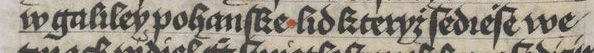w galiley pohanſke.lid kteryż ſedieẛe we
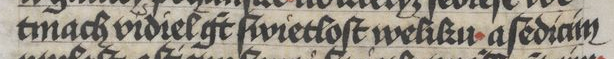tmách vidiel ḡt ſwietloſt weliku.a ſedícím
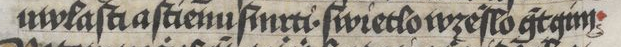uwlaſti a ſtienu ſmrti.ſwietlo wzeẛlo ḡt gim.
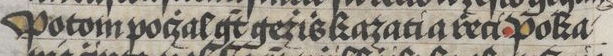Potom pocżal ḡt geżiš kazati a ṙeci.Poka¬
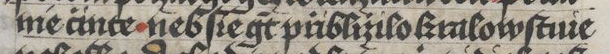níe ċinte.neb ſie ḡt pṙibliżilo kralowſtuie
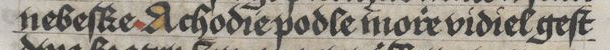nebeſke.A chodie podle moṙe uidiel geſt
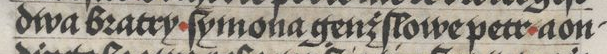dwa bratry.ſymona genż ſlowe petr.a on¬
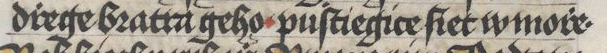dṙege bratra geho.puẛtiegíce ſiet w moṙe.
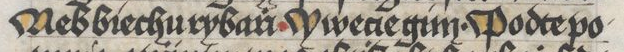Neb biechu rybaṙi.Y wecie gím.Podte po¬
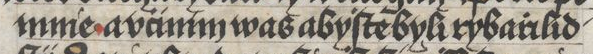mnie.a vċíním was abyẛte byli rybaṙi lid¬
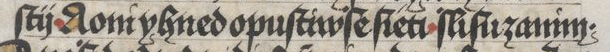ſtij.Aoni yhned opuſtiwẛe ſieti.ẛli ſu zanim.
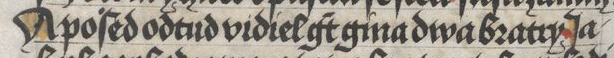A poẛed odtud uidiel ḡt gina dwa bratry.Ia¬
